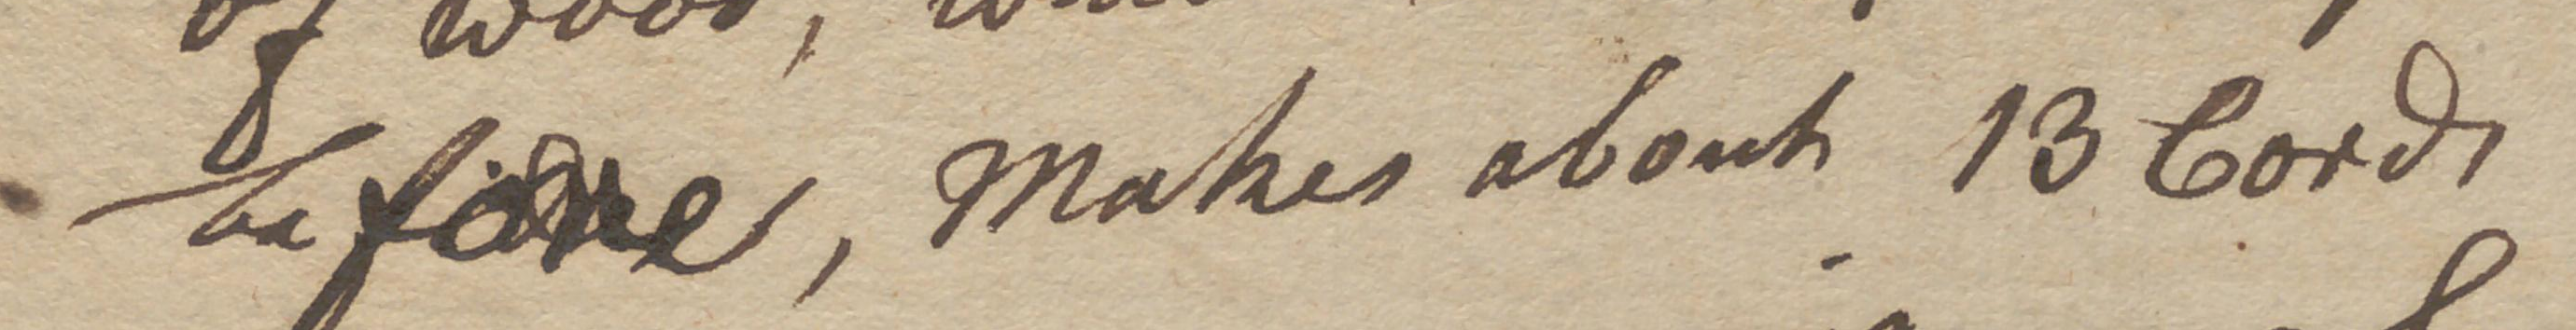before, makes about 13 Cords
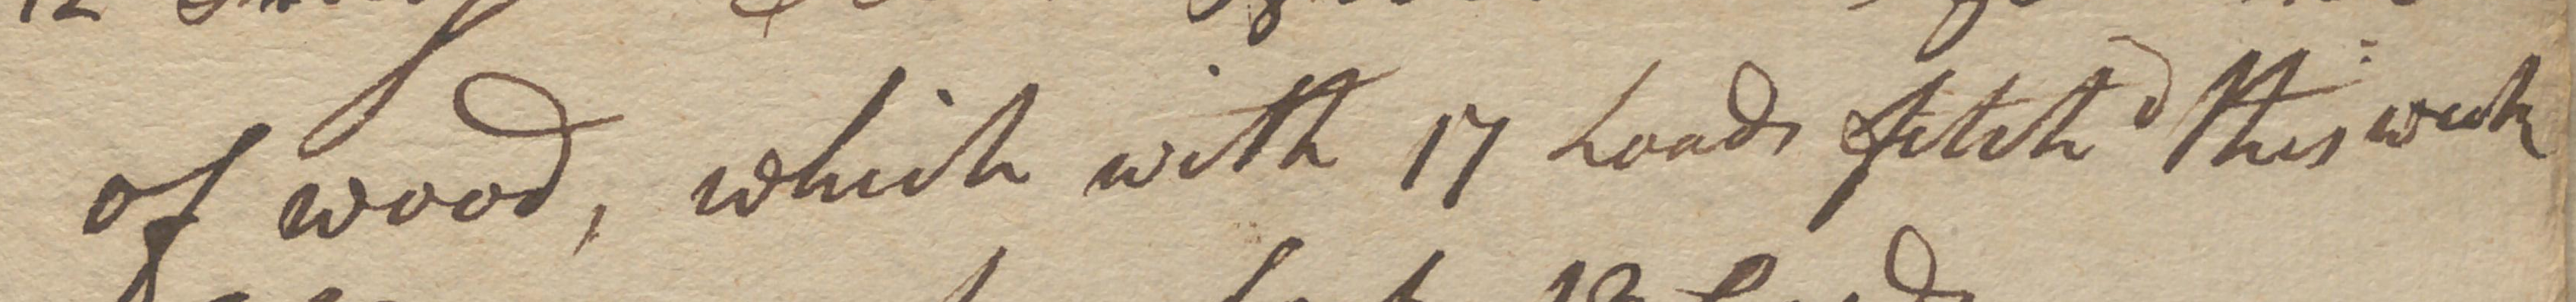of wood, which with 17 Loads fetch^d this week
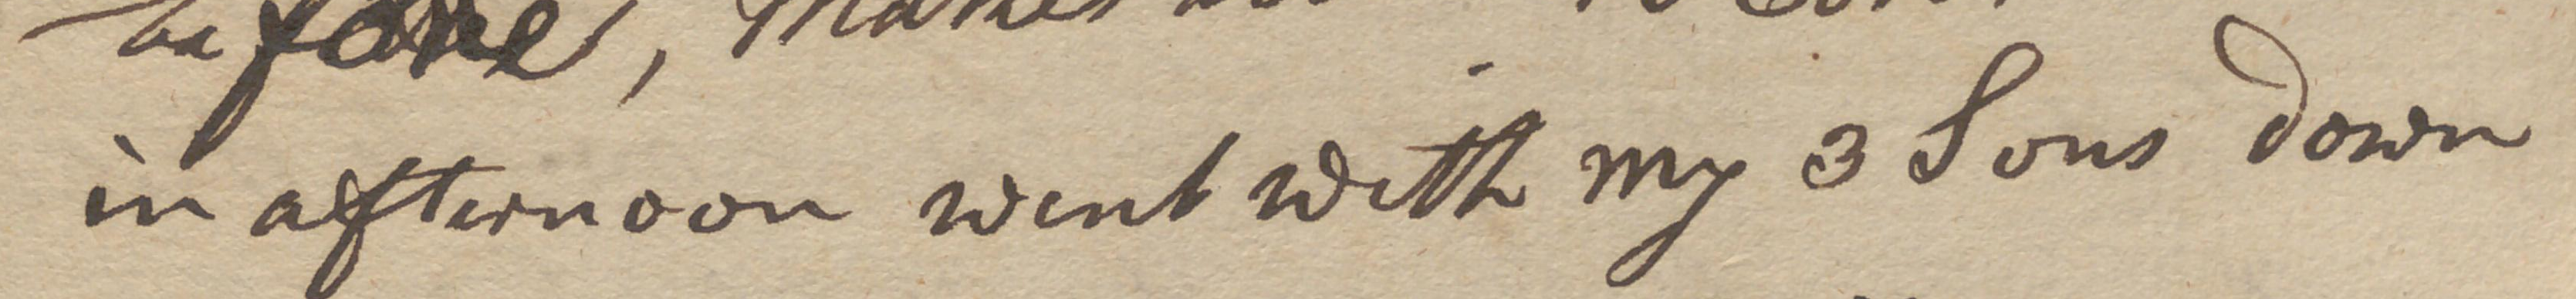in afternoon went with my 3 Sons down
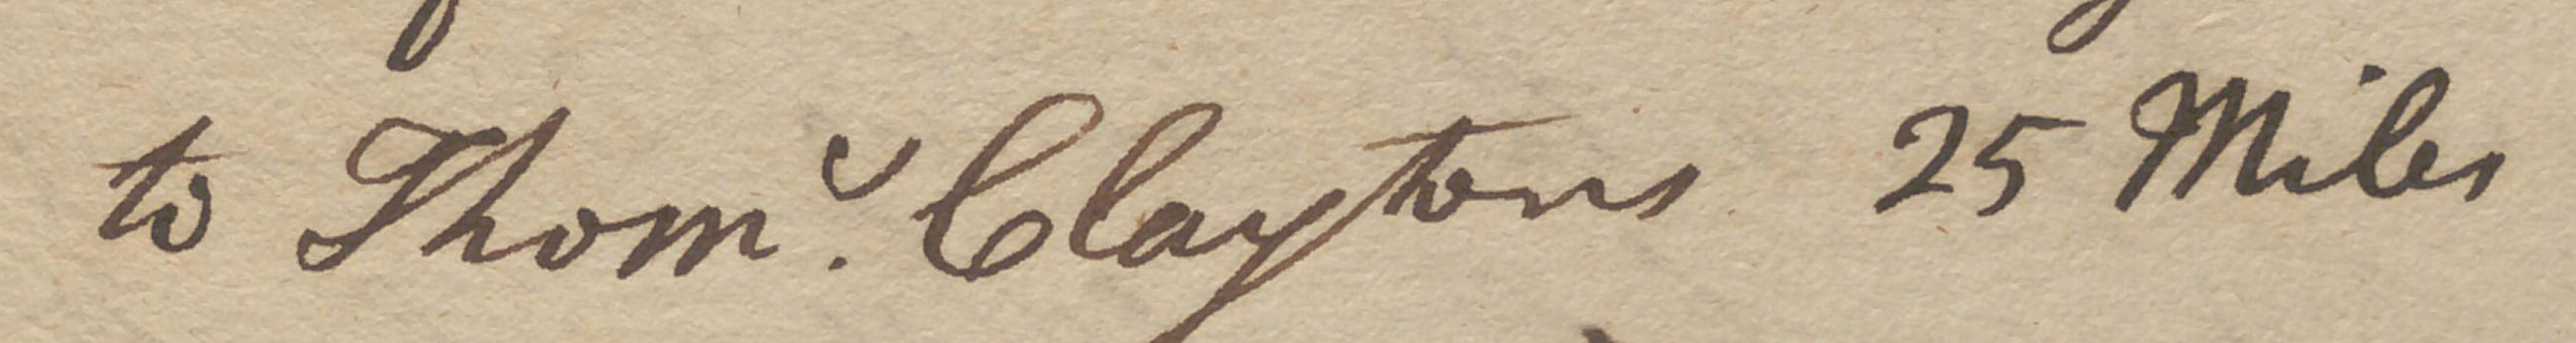to Thom^s. Claytons 25 Miles
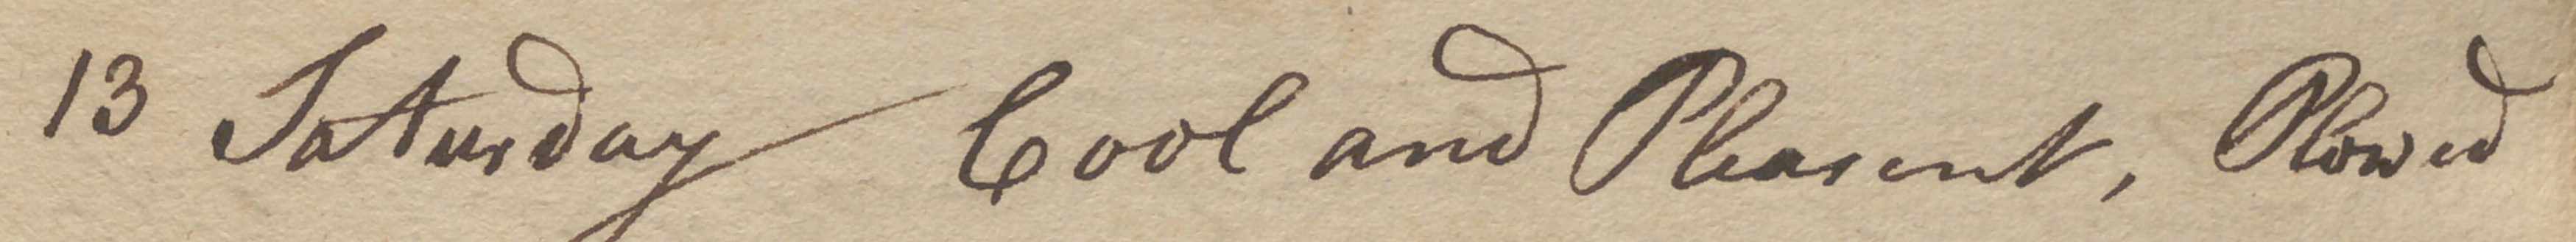13 Saturday Cool and Pleasent, Plowed
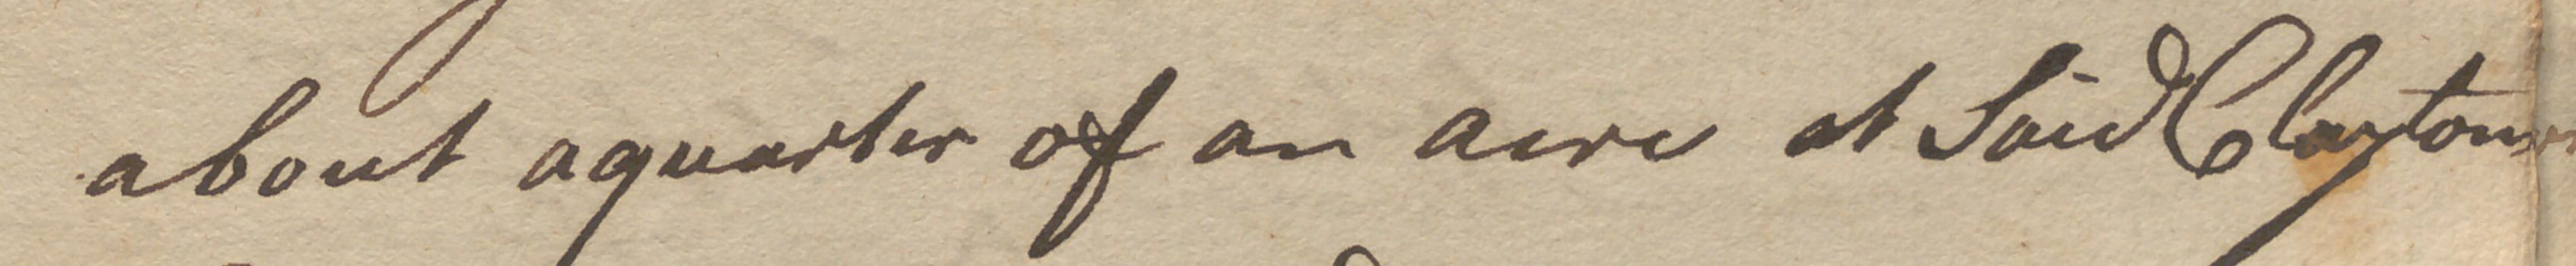about a quarter of an acre at Said Clayton
